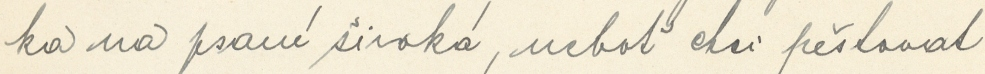ka na psaní široká, neboť chci pěstovat
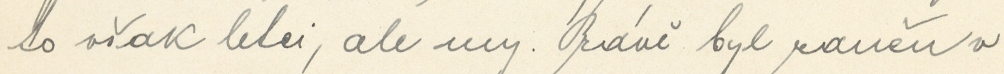to však letci, ale my. Právě byl raněn v
